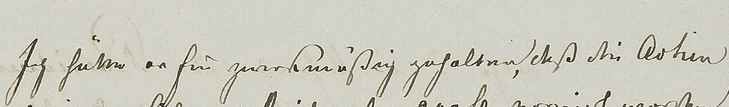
Ich hätte es für zwekmäßig gehalten, daß die Actien
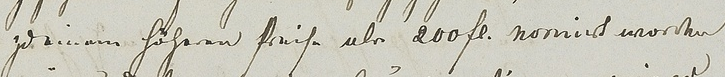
zu einem höheren Preise als 200 fl. nomirt worden
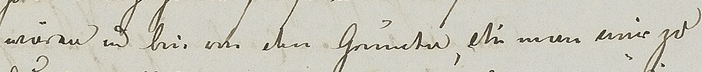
wären und bin von den Gründen, die man mir zu
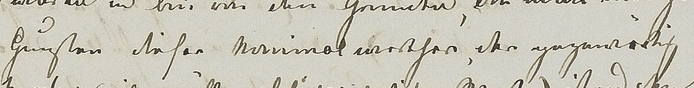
Gunsten dieses Nominalwerthes, der gegenwärtig
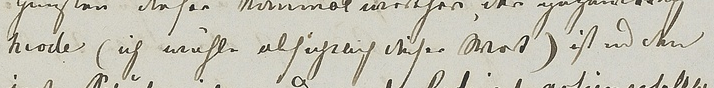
Mode (ich wähle absichtlich dieses Wort) ist und den
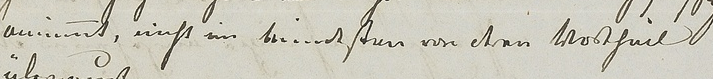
annimmt, nicht im Mindesten von dem Vortheil
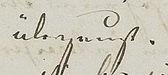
überzeugt.
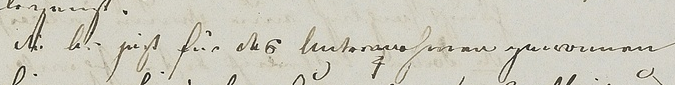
Die bis jezt für das Unternehmen gewonnen
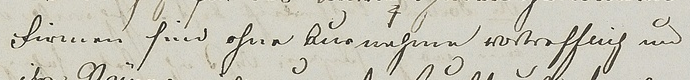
Firmen sind ohne Ausnahme vortrefflich und
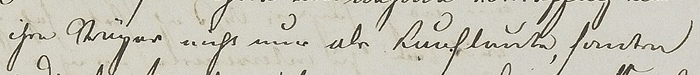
ihre Träger nicht nur als Kaufleute, sondern
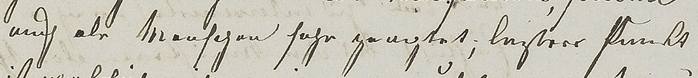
auch als Menschen sehr geachtet; leztrer Punkt
